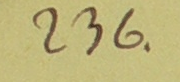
236
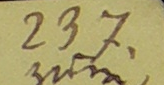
237
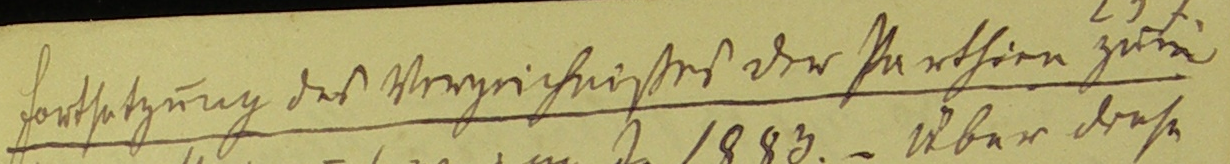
Fortsetzung des Verzeichnißes der Parthien zum
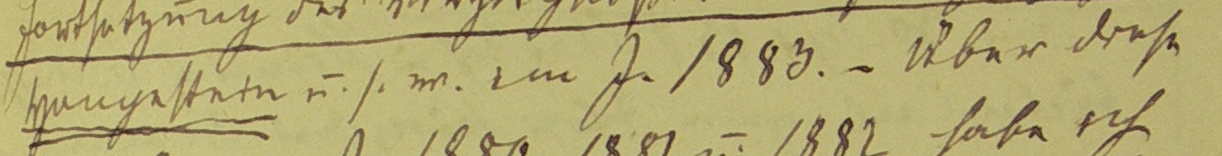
Hangestein u.s.w. im Jahre 1883.-Über diese
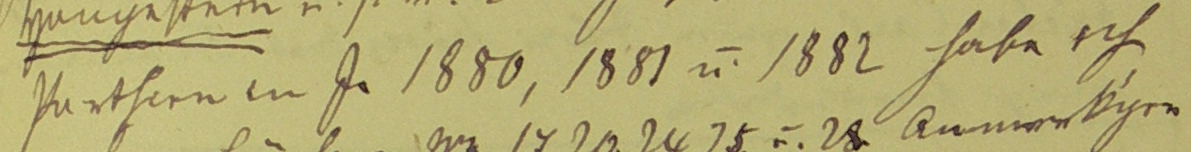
Parthien im Jahre 1880. 1881 und 1882 habe ich
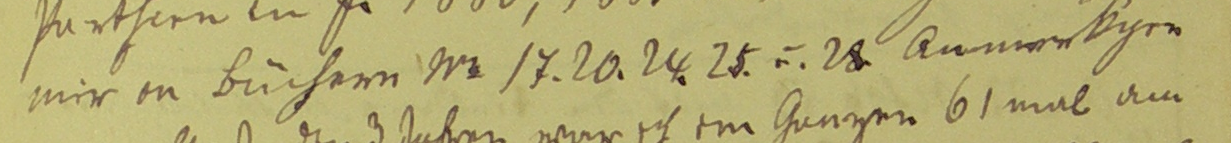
mir in den Büchern Nr: 17, 20, 24, und 25 Anmerkungen
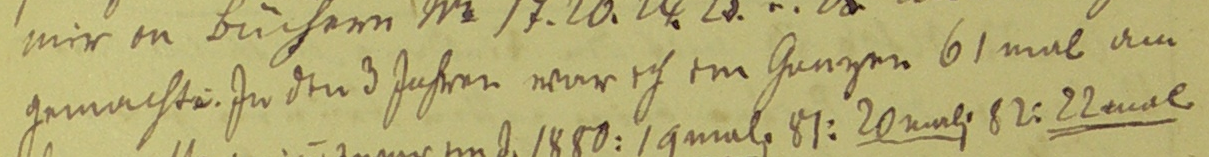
gemacht. In den 3 Jahren war ich im Ganzen 61 mal am
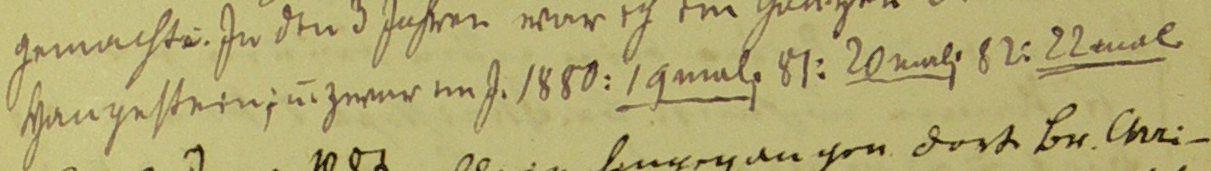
Hangestein, und zwar im Jahre 1880: 19 mal, 81. 20 mal, 82. 22 mal.
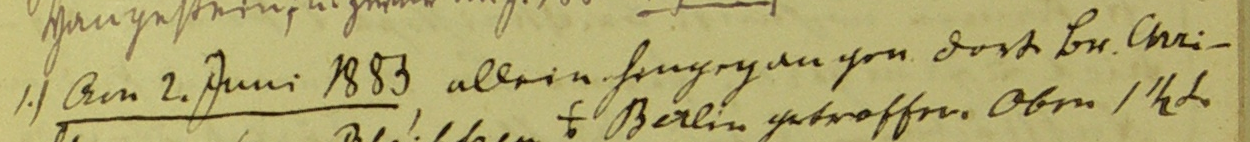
1) Am 2. Juni 1883, allein hingegangen dort Br. Chri¬
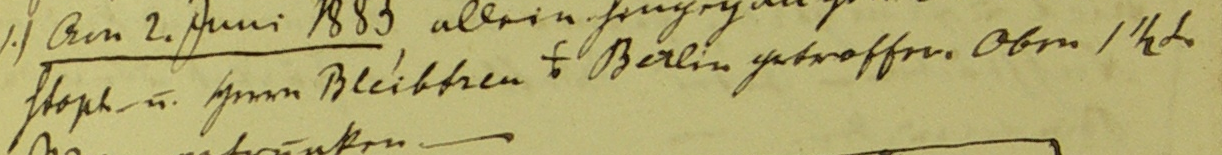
stof und Herrn Bleibtreu aus Berlin getroffen. Oben 1 ½ L
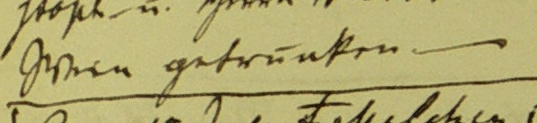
Wein getrunken--
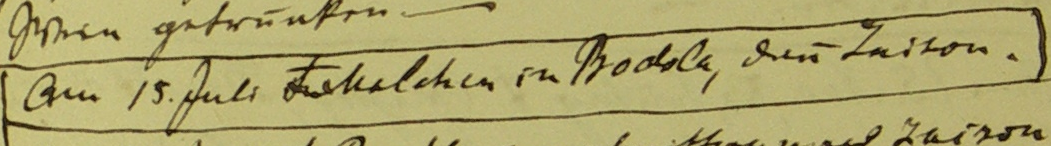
Am 15. Juli mit Malchen in Bodala, dann Zaizon
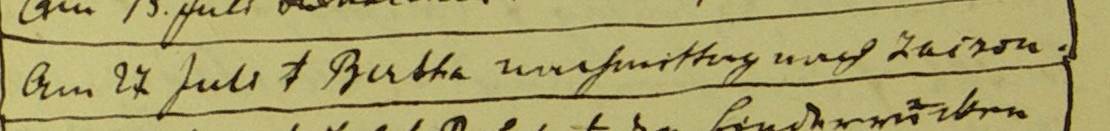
Am 27 Juli mit Bertha nachmittag nach Zaizon
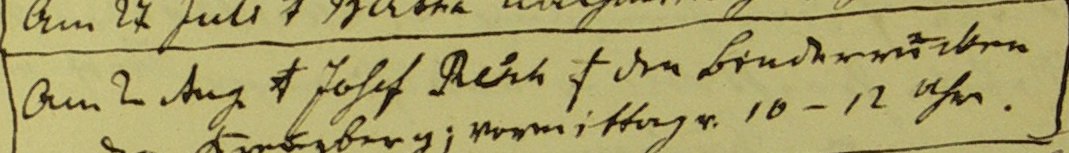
Am 2. Aug. mit Josef Resch mit den Bindermädchenun
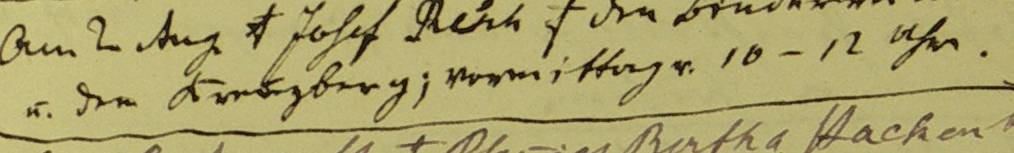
auf dem Kreuzberg; vormittags von 10-12 Uhr.
